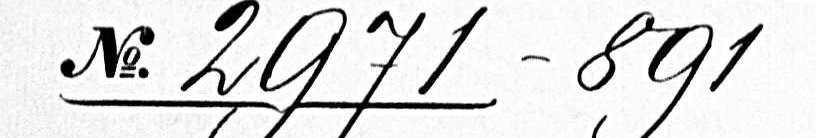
No. 2971 - 1891
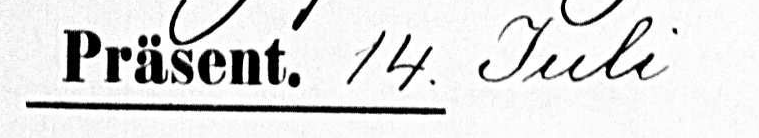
Präsent. 14. Juli
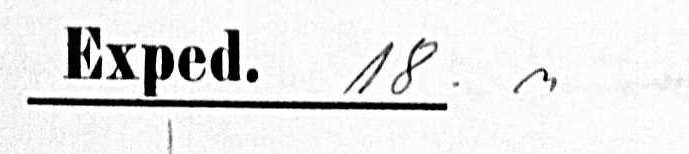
Exped. 18. Juli
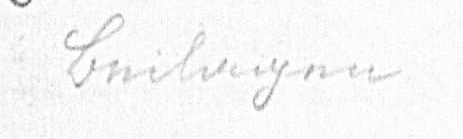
Beilagen
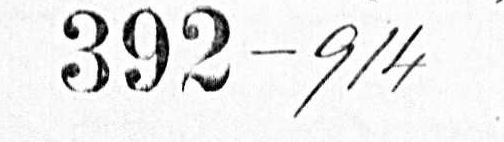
392 - 1914
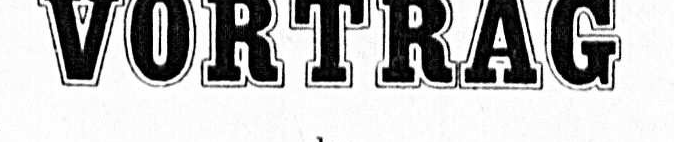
VORTRAG
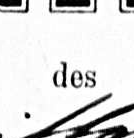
des
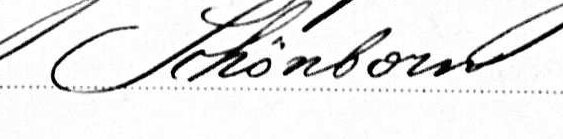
Schönborn
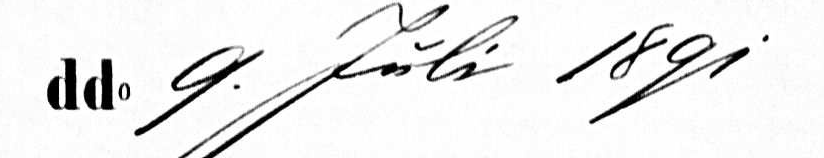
ddo 9. Juli 1891
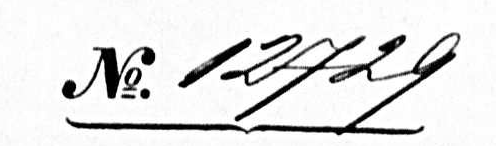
No. 12729
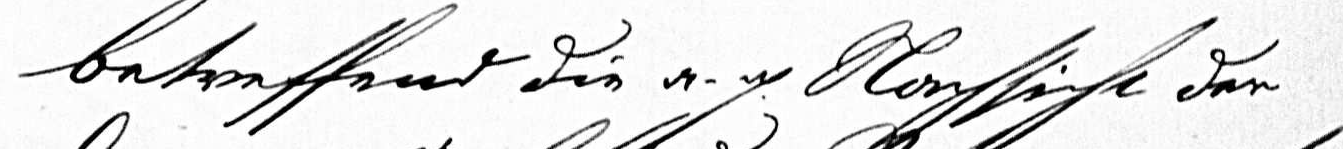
betreffend die a.g. Nachsicht der
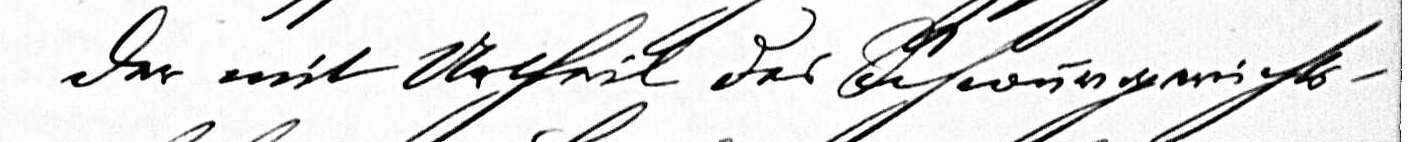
der mit Urtheil des Schwurgerichts¬
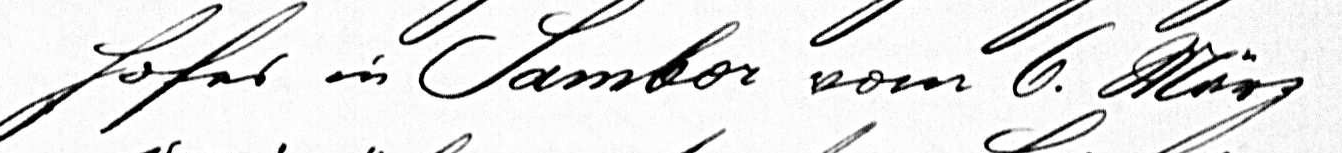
hofes in Sambor vom 6. März
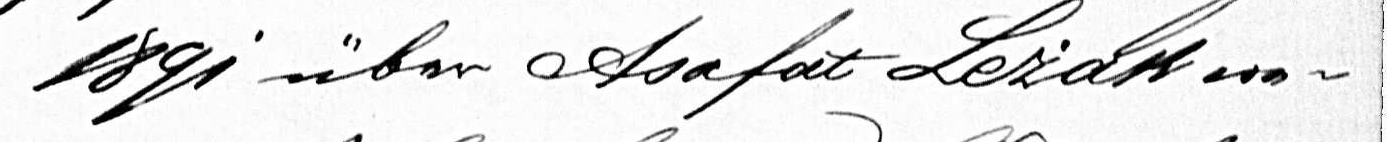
1891 über Asafat Leżak we¬
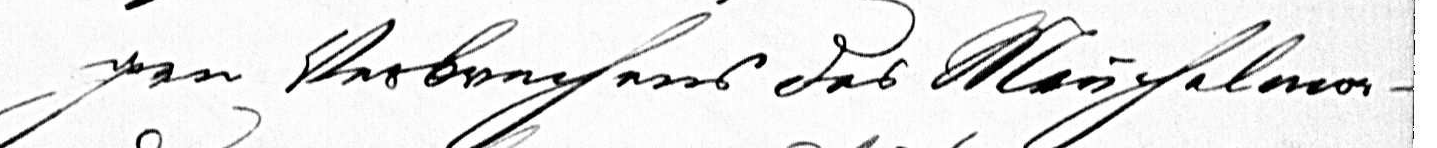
gen Verbrechens des Meuchelmor¬
